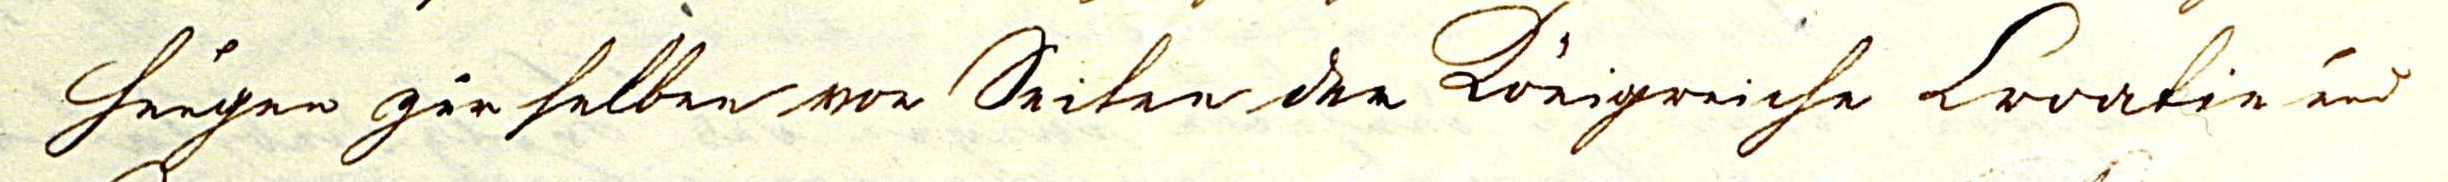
hungen zur selben von Seiten der Königreiche Croatien und
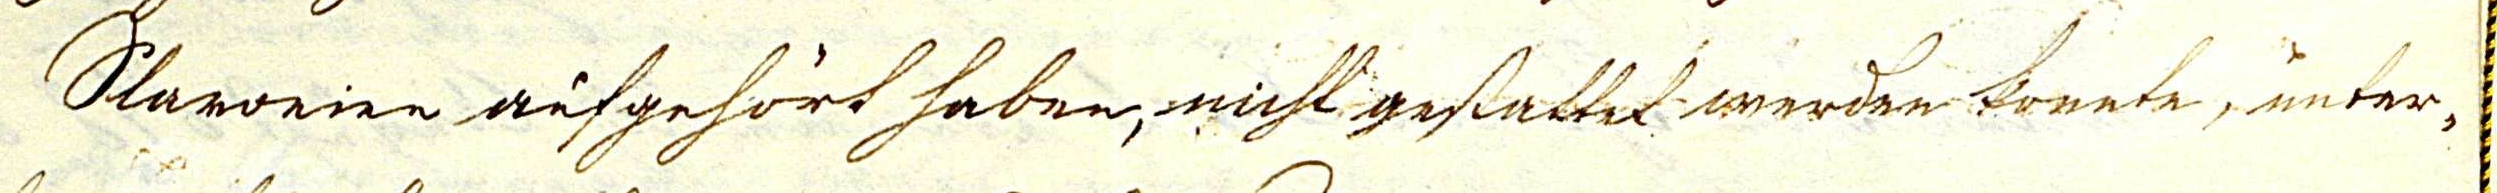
Slavonien aufgehört haben, nicht gestattet werden konnte, unter¬
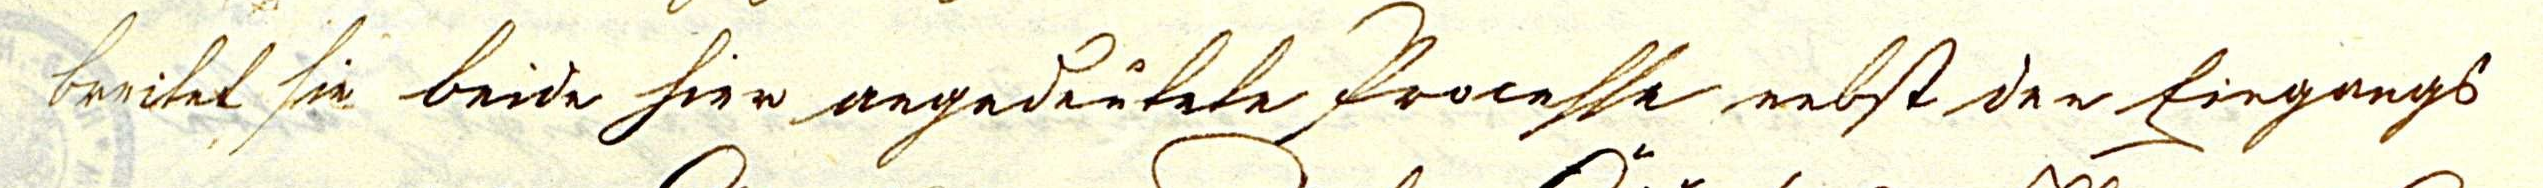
breitet sie beide hier angedeutete Processe nebst den Eingangs
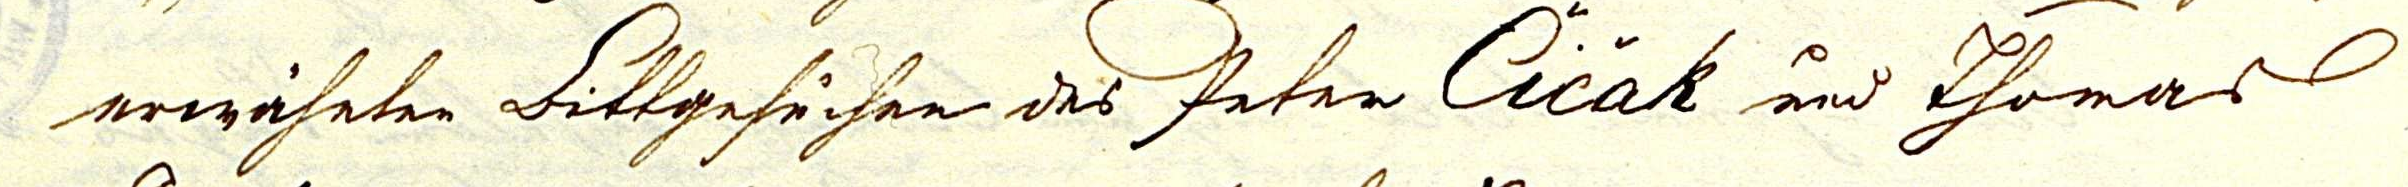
erwähnten Bittgesuche des Peter Čičak und Thomas
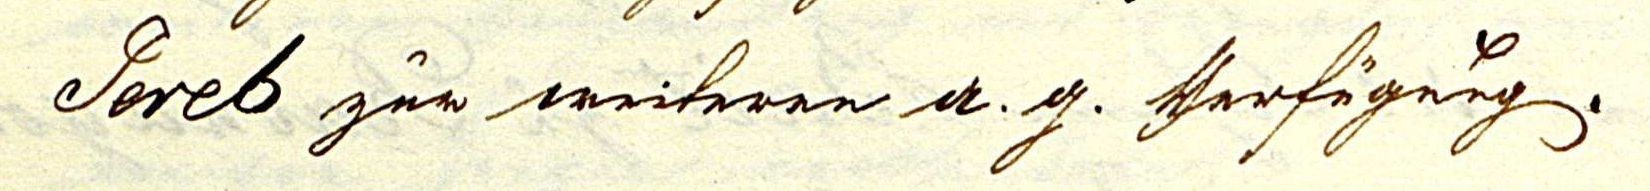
Jereb zur weiteren a.g. Verfügung.
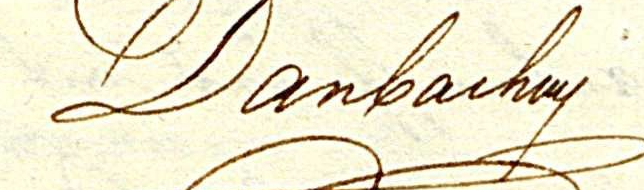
Daubachy
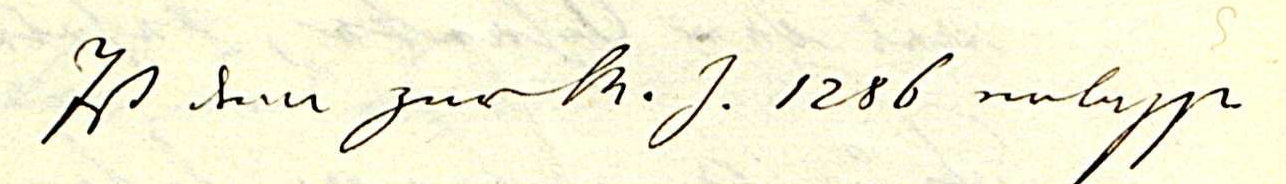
Ist dem zur M.Z. 1286 erlassenen
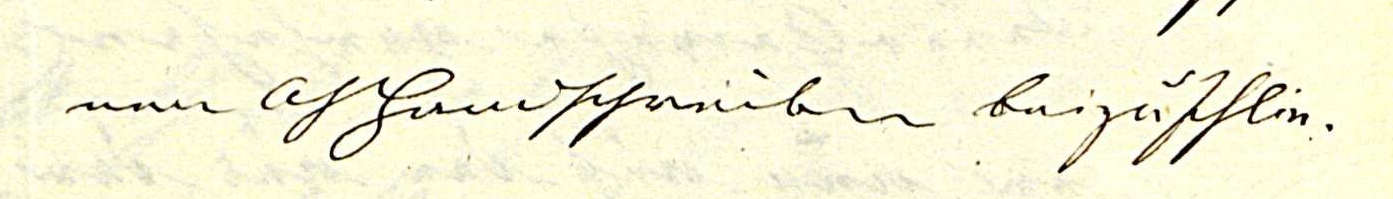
Ah Handschreiben beizuschlie¬
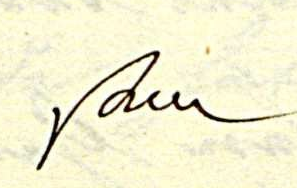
ßen.
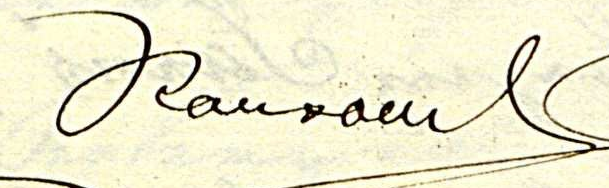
Rauvam
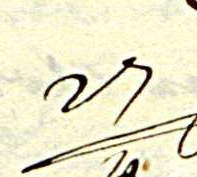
27/
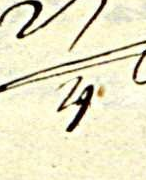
29
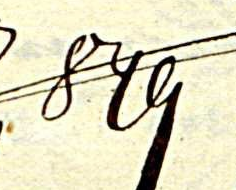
849
